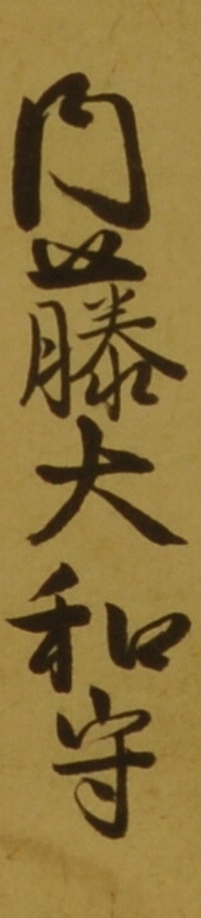内藤大和守

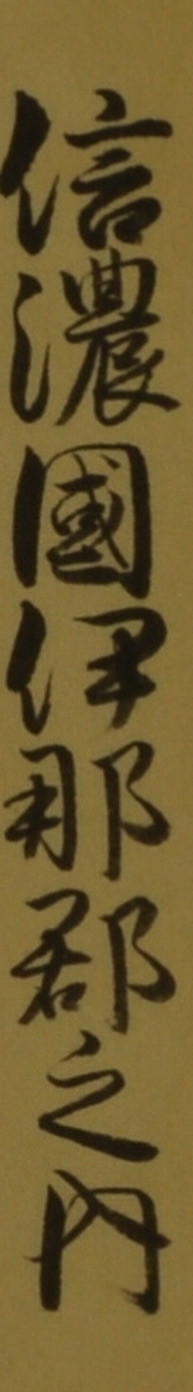信濃国伊那郡之内
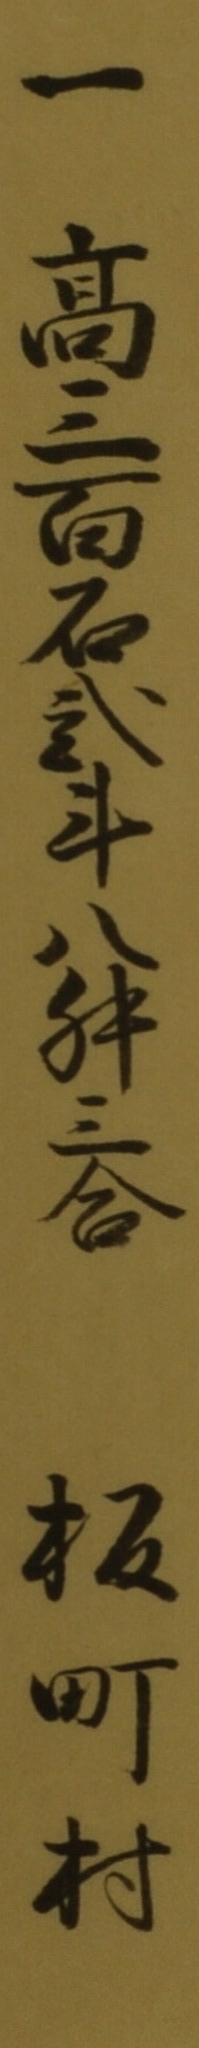一高三百石弐斗八升三合板町村

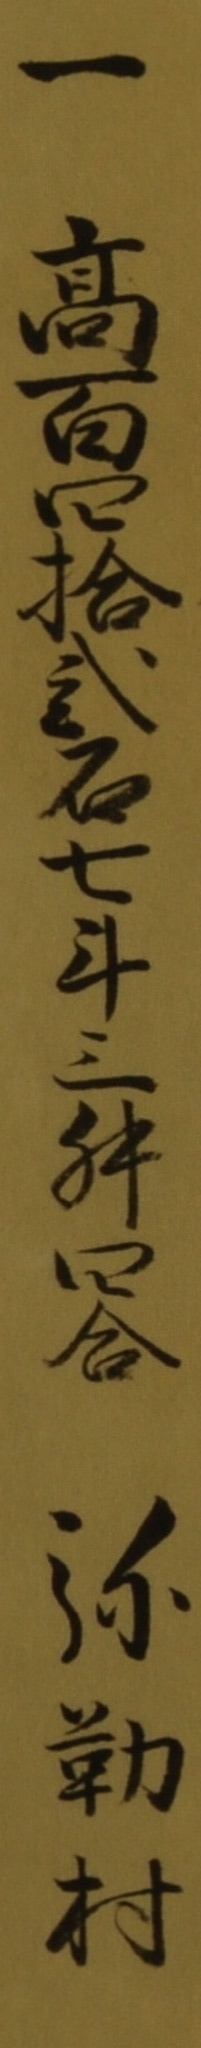一高百四拾弐石七斗三升四合弥勒村
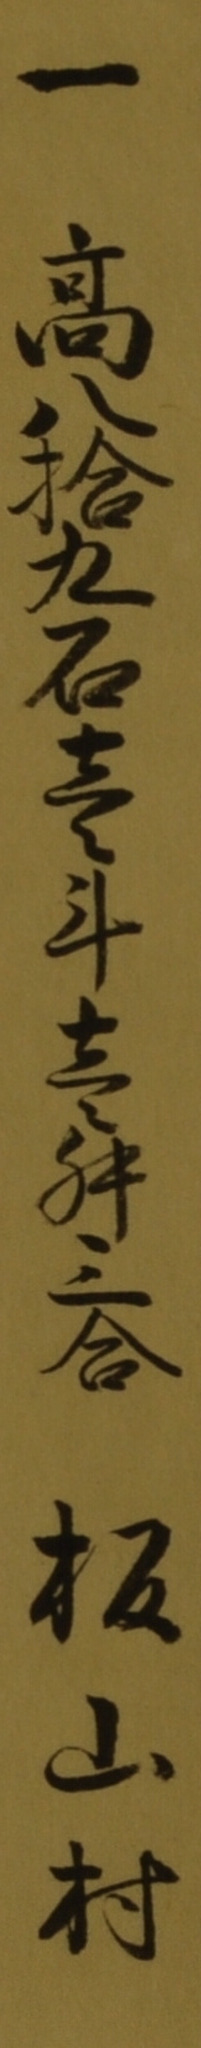一高八拾九石壱斗壱升三合板山村
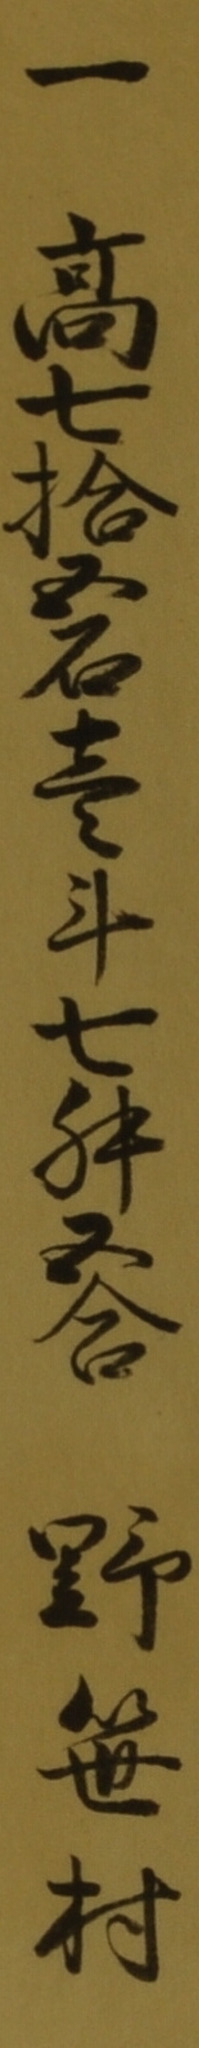一高七拾五石壱斗七升五合野笹村
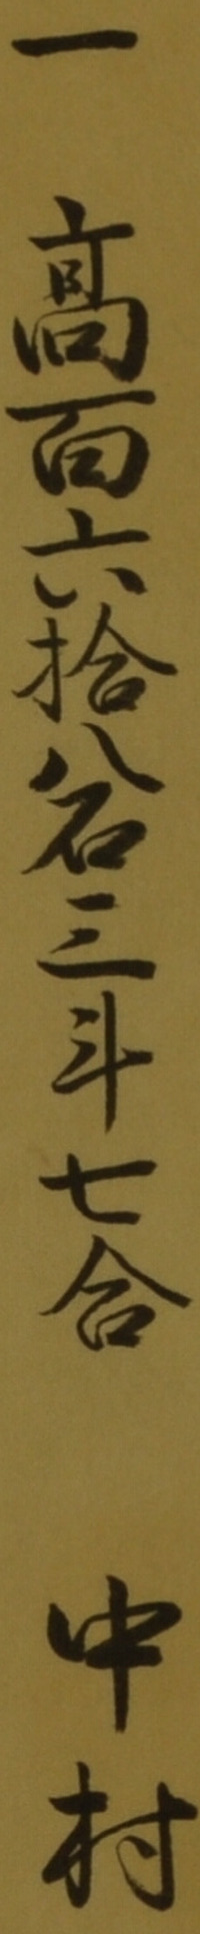一高百六拾八石三斗七合中村
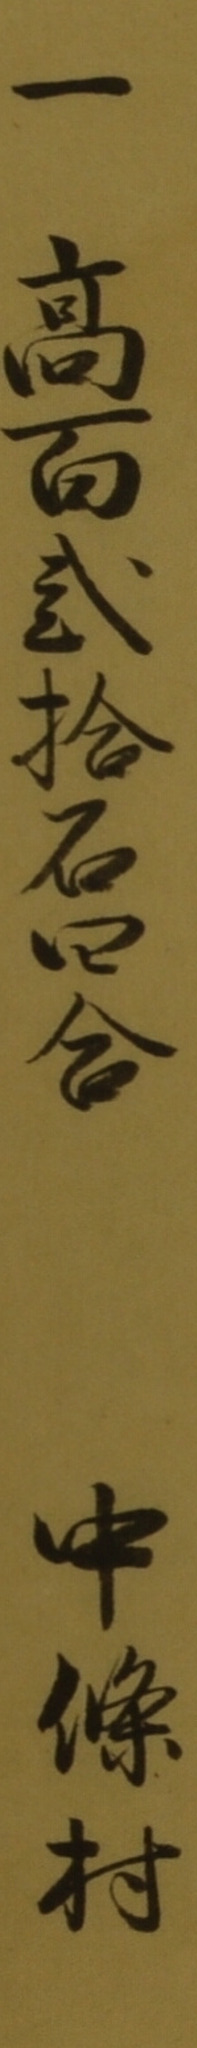一高百弐拾石四合中条村
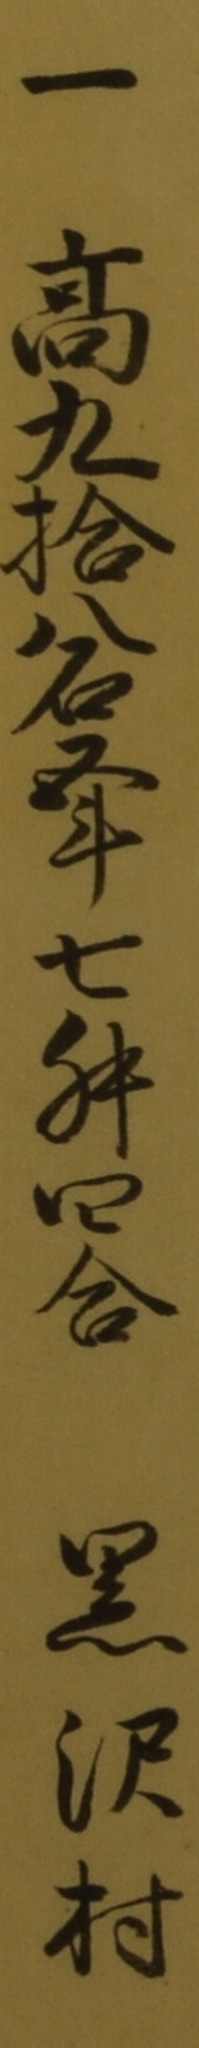一高九拾八石五斗七升四合黒沢村

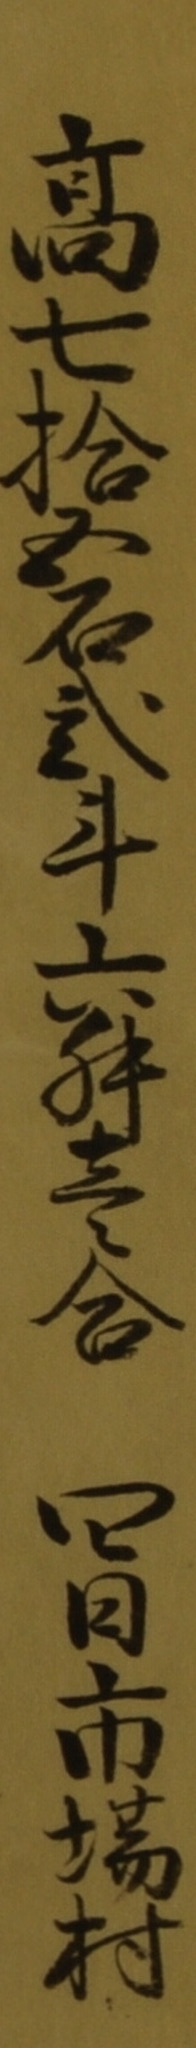一高七拾五石弐斗六升壱合四日市場村
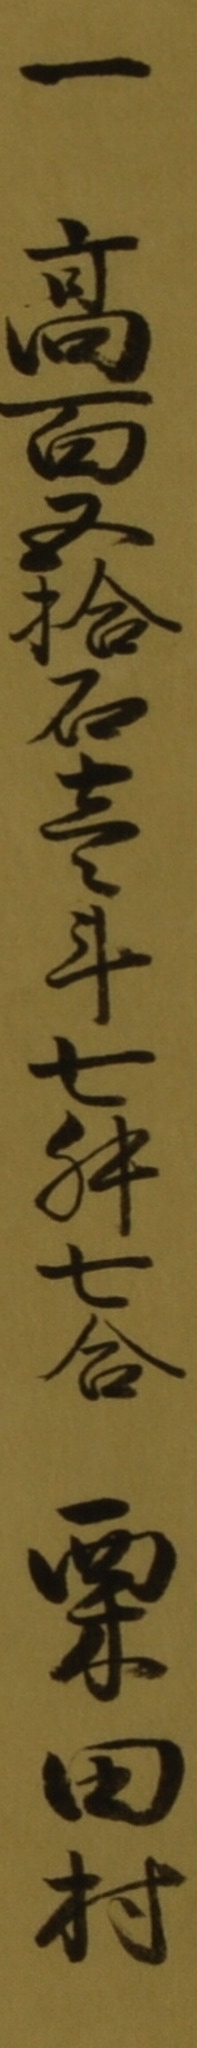一高百五拾石壱斗七升七合栗田村
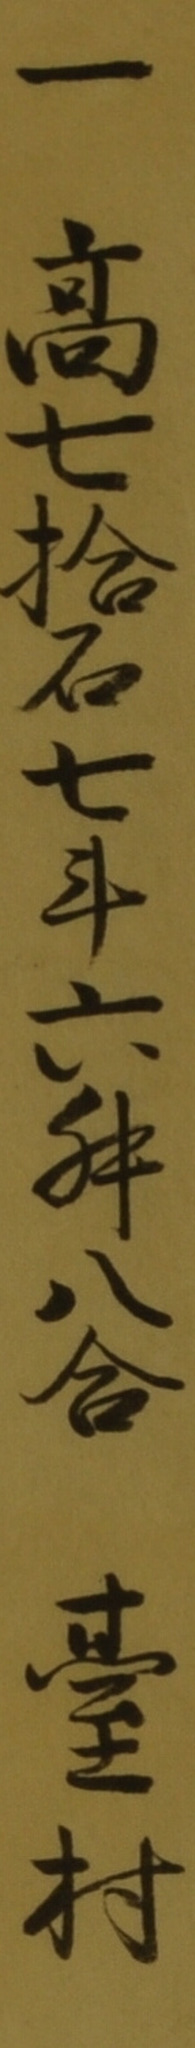一高七拾石七斗六升八合台村
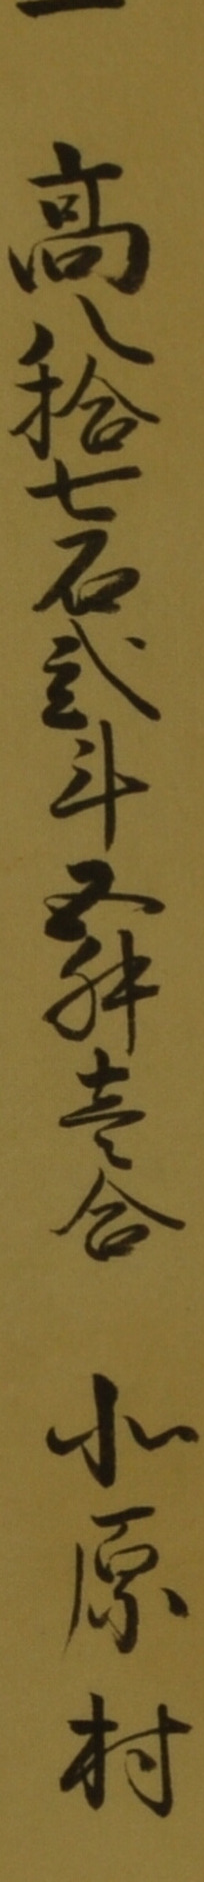一高八拾七石弐斗五升壱合北原村
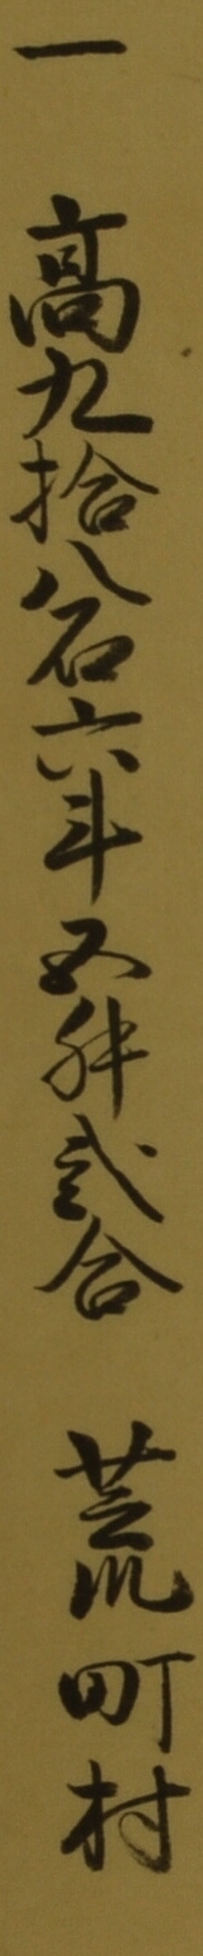一高九拾八石六斗五升弐合荒町村
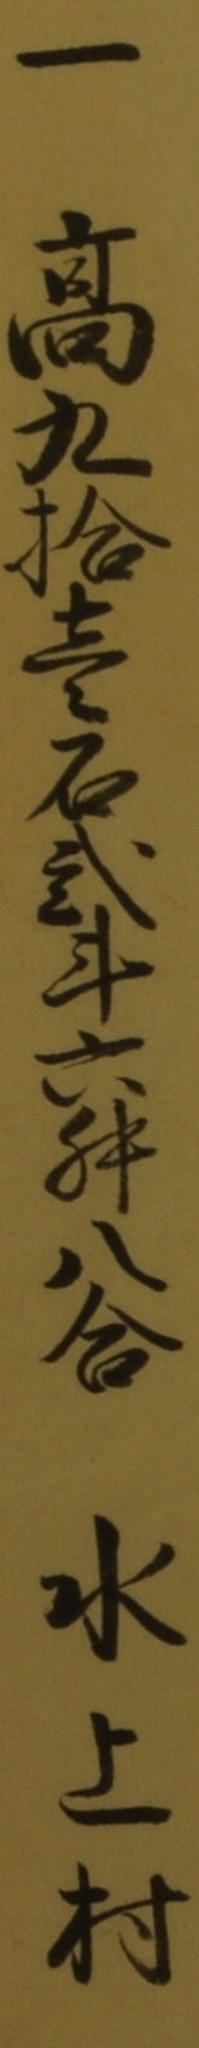一高九拾壱石弐斗六升八合水上村

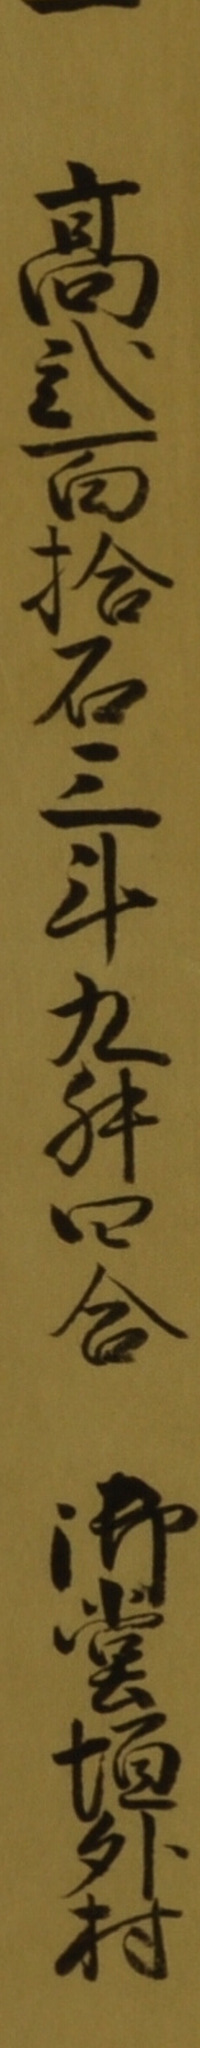一高弐百拾石三斗九升四合御堂垣外村
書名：信濃国伊那郡筑摩郡高遠領知郷村高辻帳
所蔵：伊那市立高遠町図書館・合同会社AMANE
